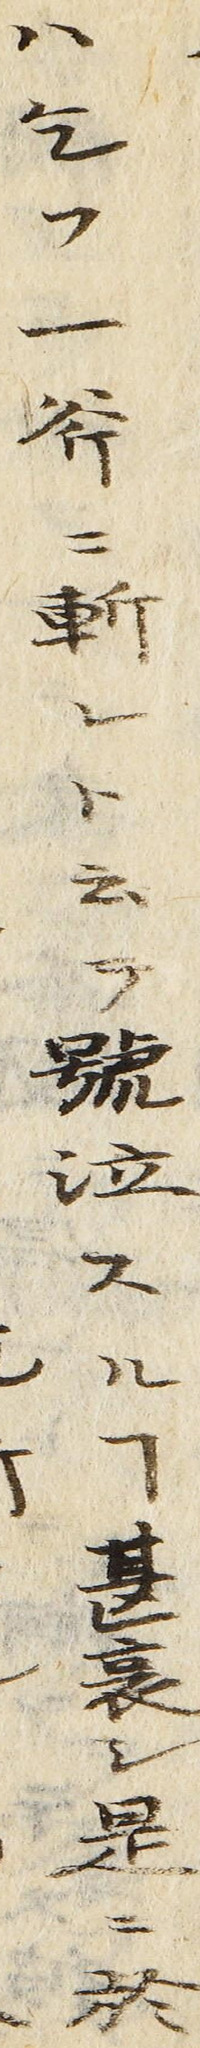ハ乞フ一斧ニ斬レト云テ号泣スルコト甚哀レ是ニ於
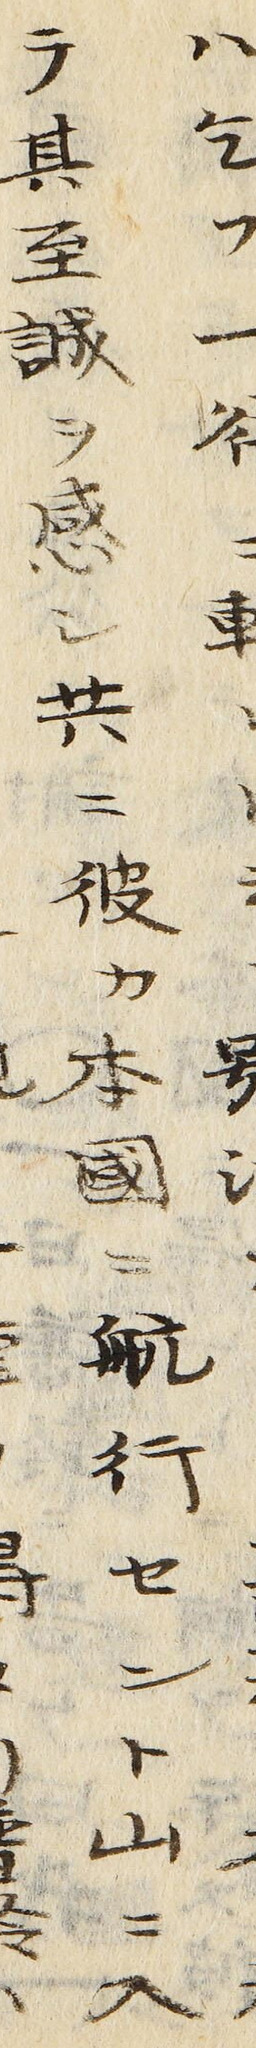テ其至誠ヲ感シ共ニ彼カ本国ニ航行セント山ニ入
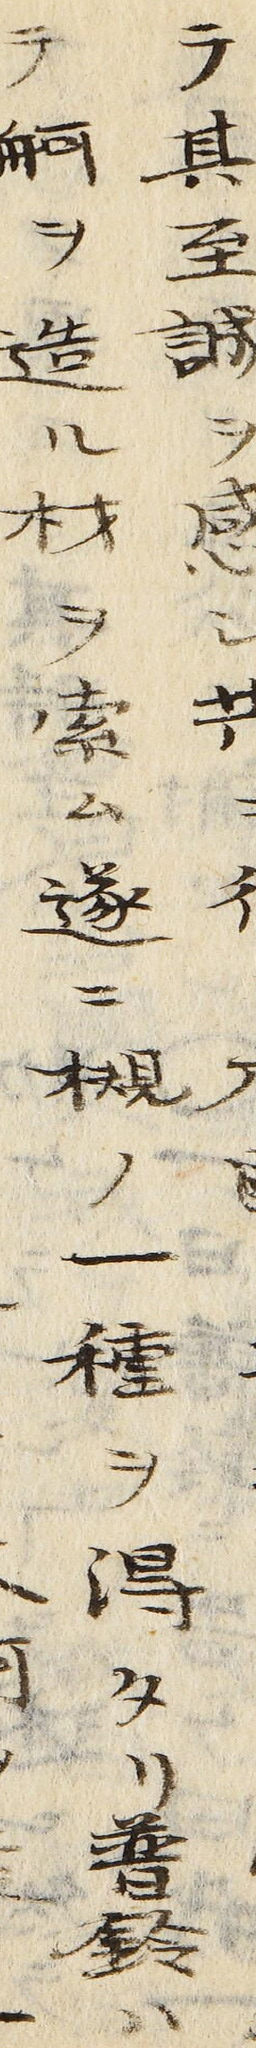テ舸ヲ造ル材ヲ索ム遂ニ槻ノ一種ヲ得タリ普鈴ハ
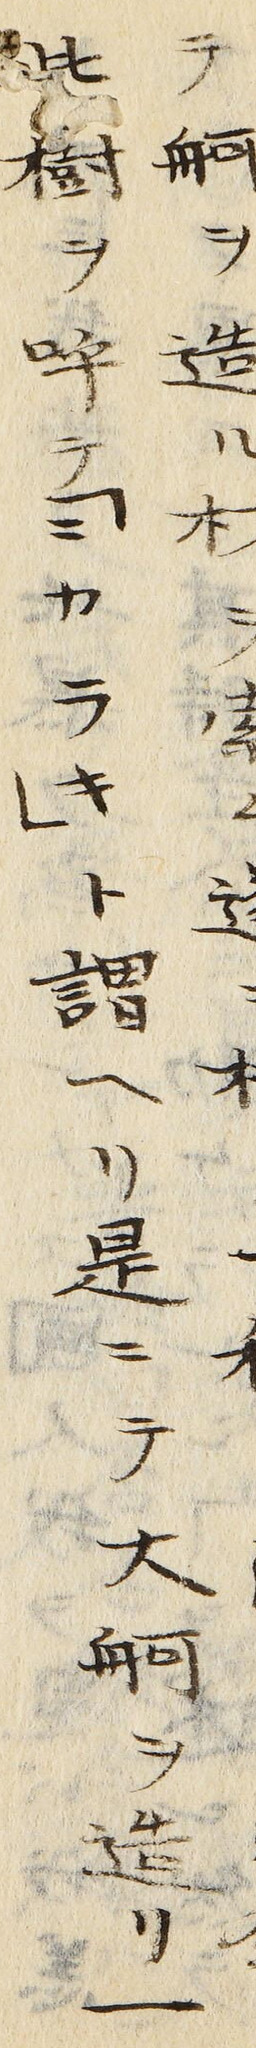此樹ヲ呼テ「ニカラキ」ト謂ヘリ是ニテ大舸ヲ造リ一
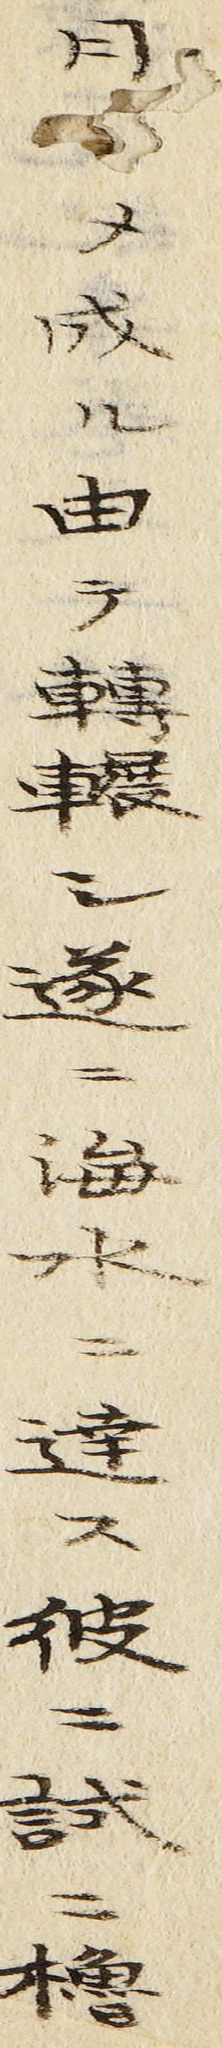月⬜︎シテ成ル由テ転輾シ遂ニ海水ニ達ス彼ニ試ニ櫓
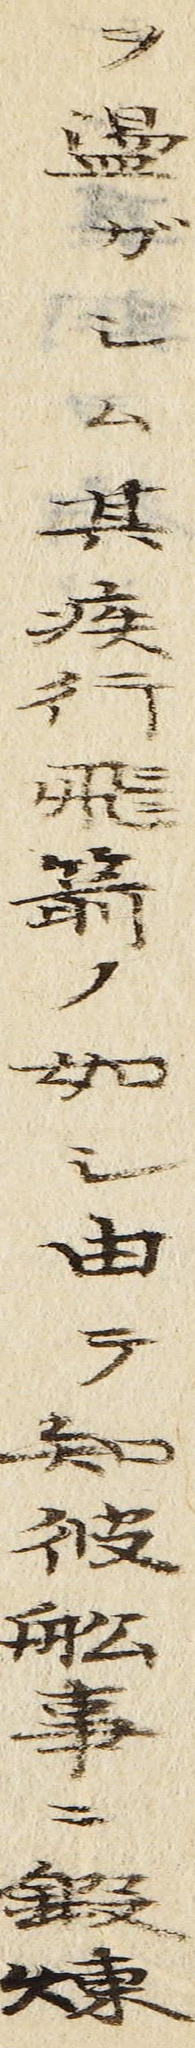ヲ盪ガシム其疾行飛箭ノ如シ由テ知彼船事ニ鍛煉
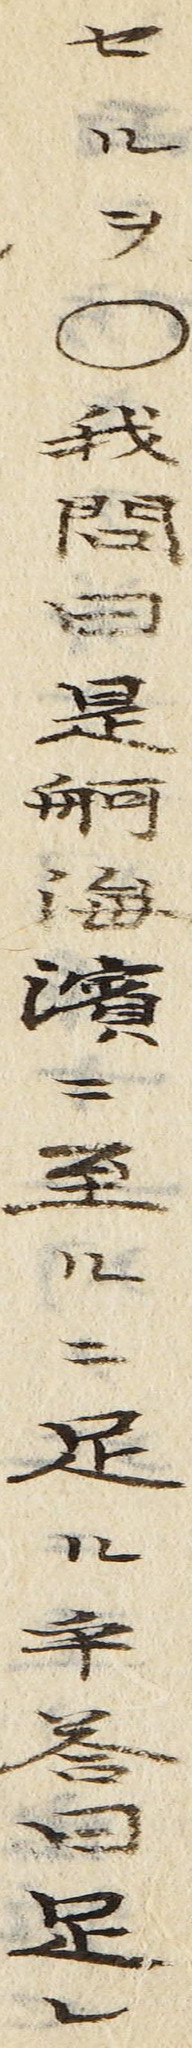セルヲ◯我問曰是舸海浜ニ至ルニ足ル乎答曰足レ
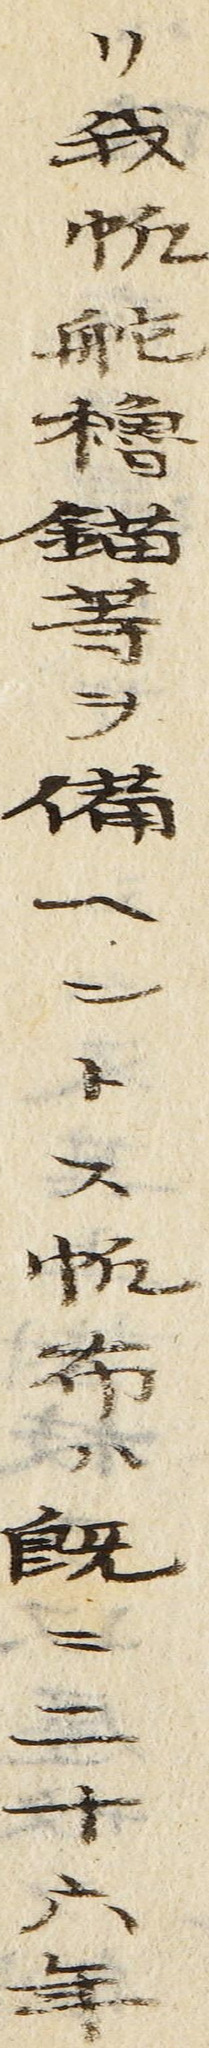リ我帆舵櫓錨等ヲ備ヘントス帆布ハ既ニ二十六年
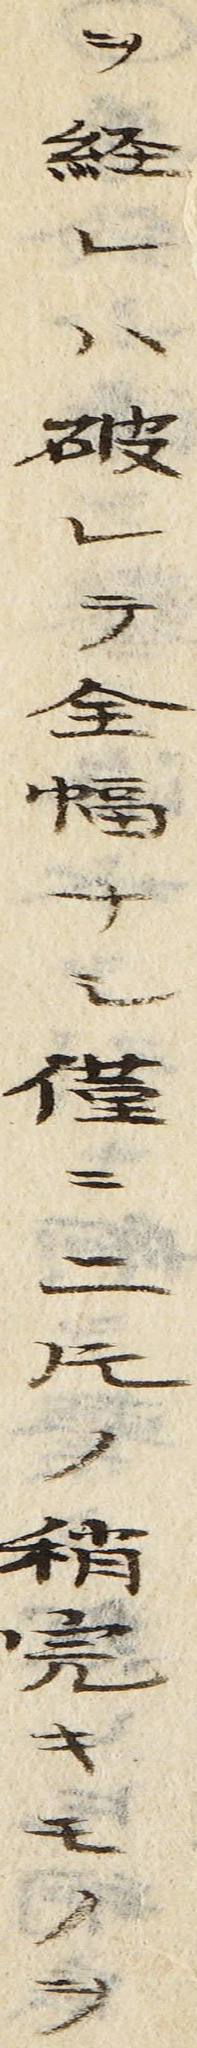ヲ経レハ破レテ全幅ナシ僅ニ二片ノ稍完キモノヲ
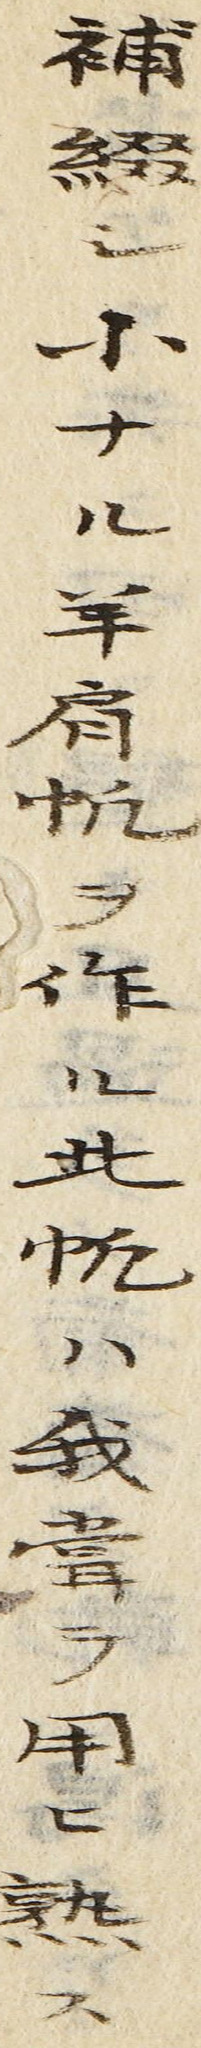補綴シ小ナル羊肩帆ヲ作ル此帆ハ我嘗テ用ヒ熟ス
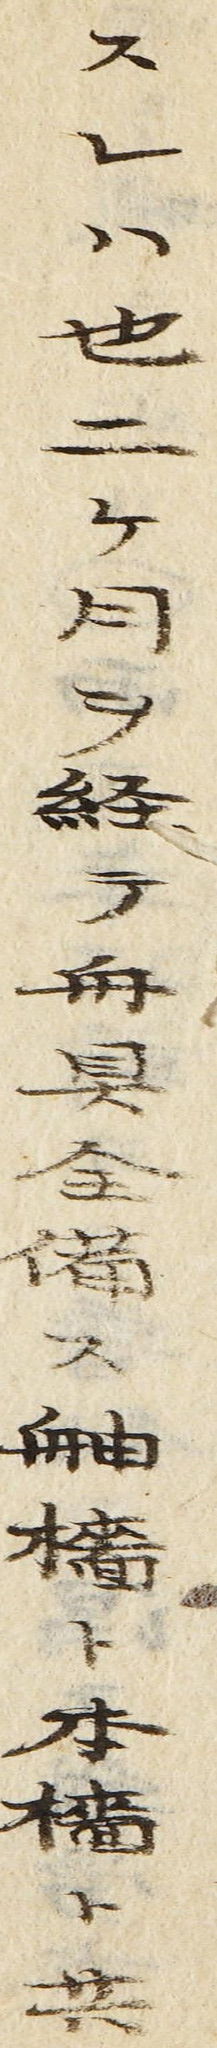スレハ也二ケ月ヲ経テ舟具全備ス舳檣ト本檣と共
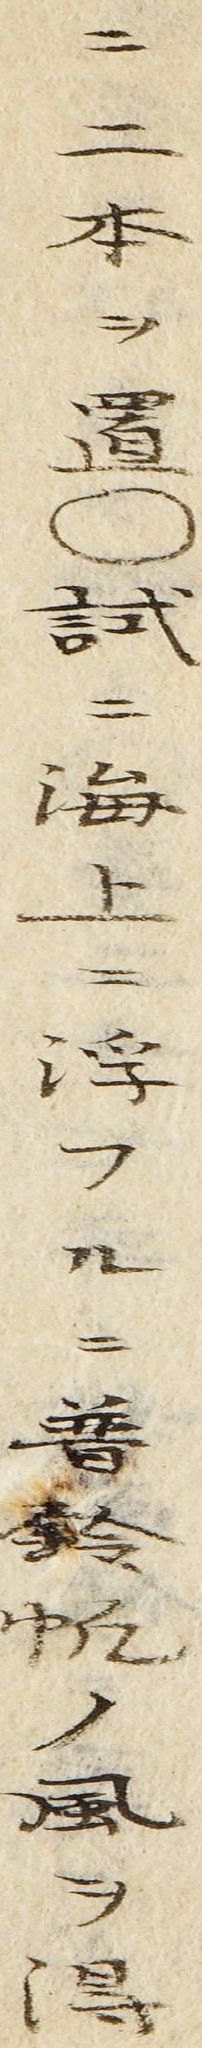ニ二本ヲ置◯試ニ海上ニ浮フルニ普鈴帆ノ風ヲ得
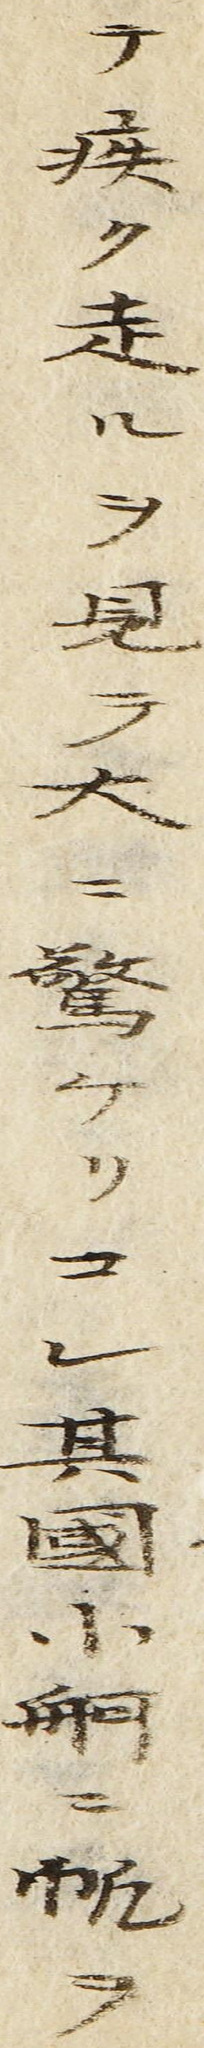テ疾ク走ルヲ見テ大ニ驚ケリコレ其国小舸ニ帆ヲ
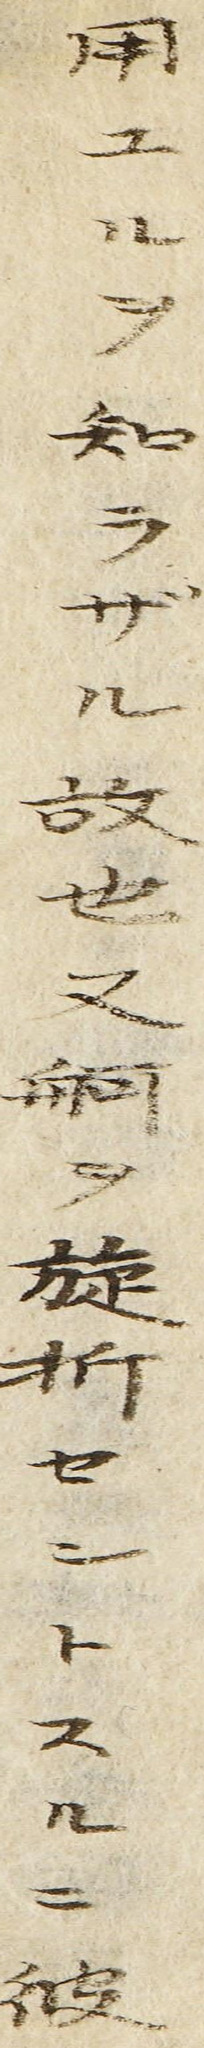用ユルヲ知ラザル故也又舸ヲ旋折セントスルニ彼
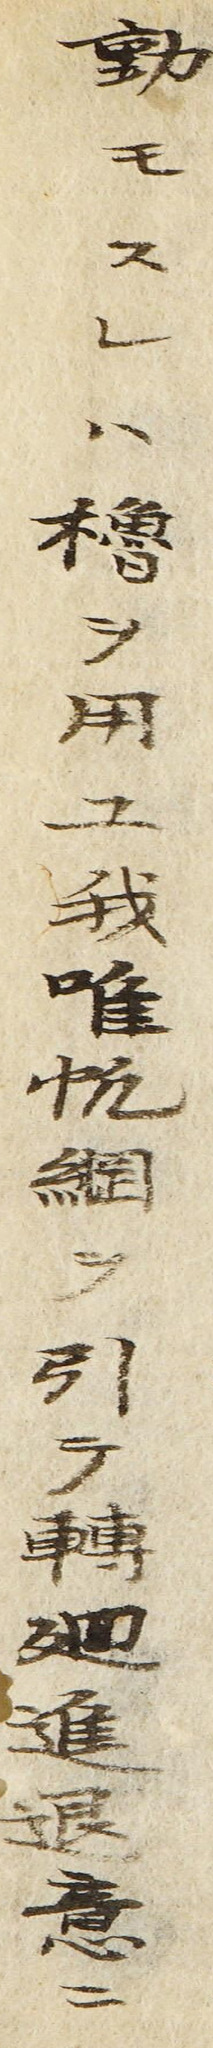動モスレハ櫓ヲ用ユ我唯帆綱ヲ引テ転廻進退意ニ

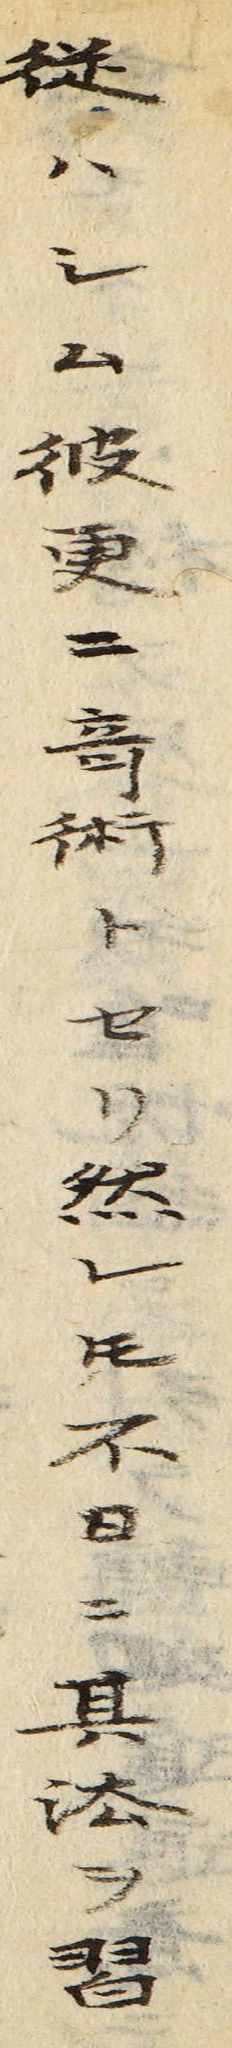従ハシム彼更ニ奇術トセリ然レトモ不日ニ其法ヲ習
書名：漂流紀事
